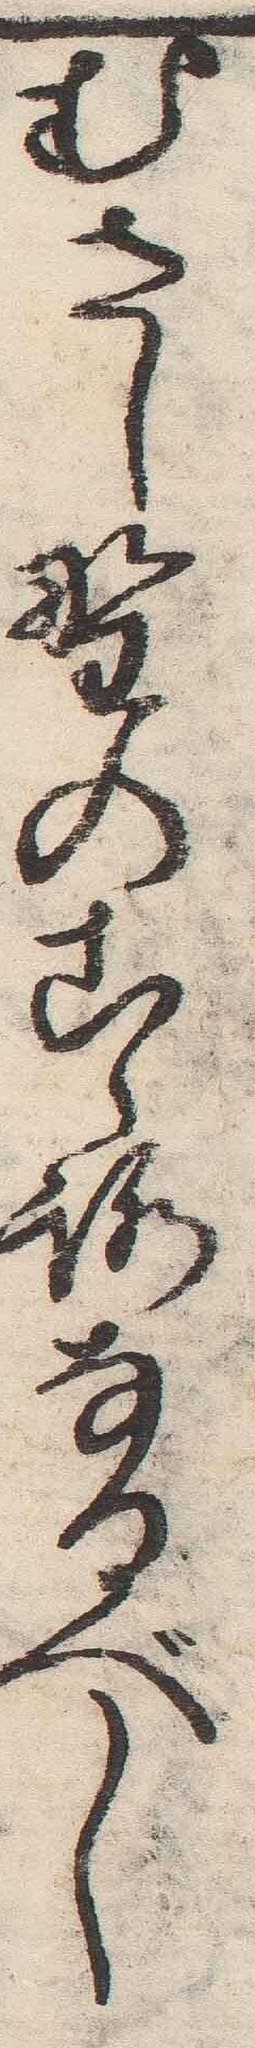むさし野のこゝろなるべし
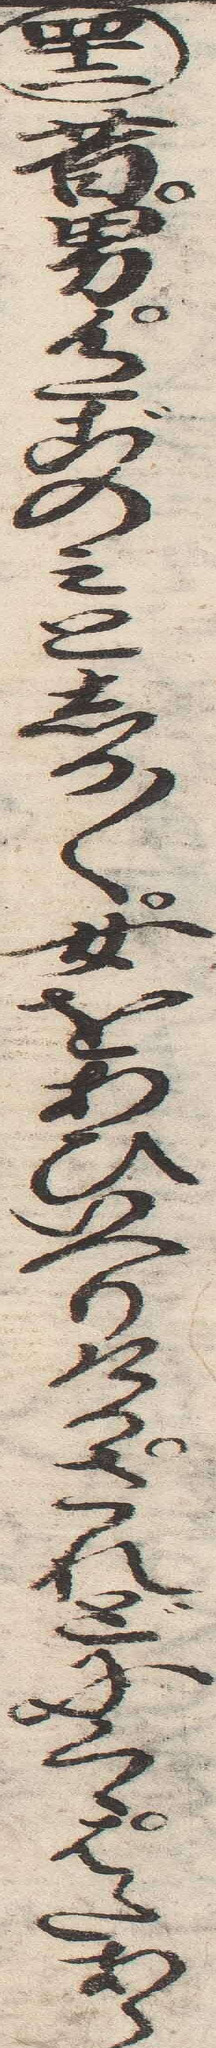四十二昔。男。色ごのみとしる〳〵。女をあひいへりける。されどにくゝ。はたあら
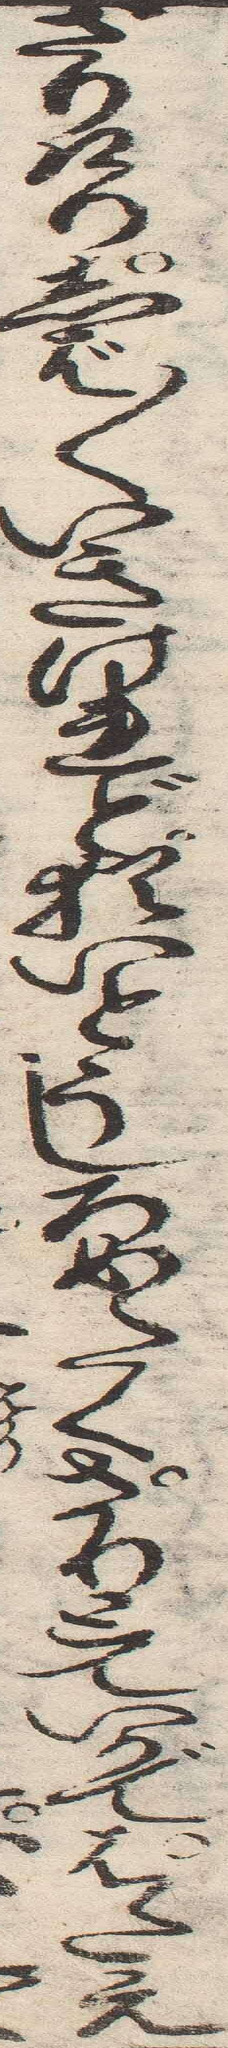ざりけり。しば〳〵いきけれど。猶いとうしろめたく。さりとていかで。はたえ
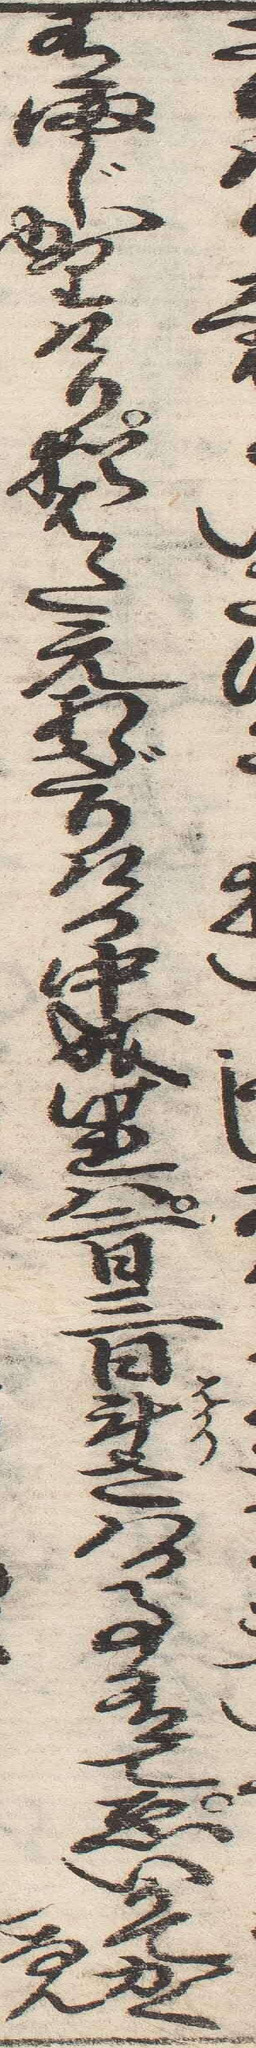有まじかりけり。猶はたえあざらりける中成けれは。二日三日計さはる事有て。ゑいかてかくなん
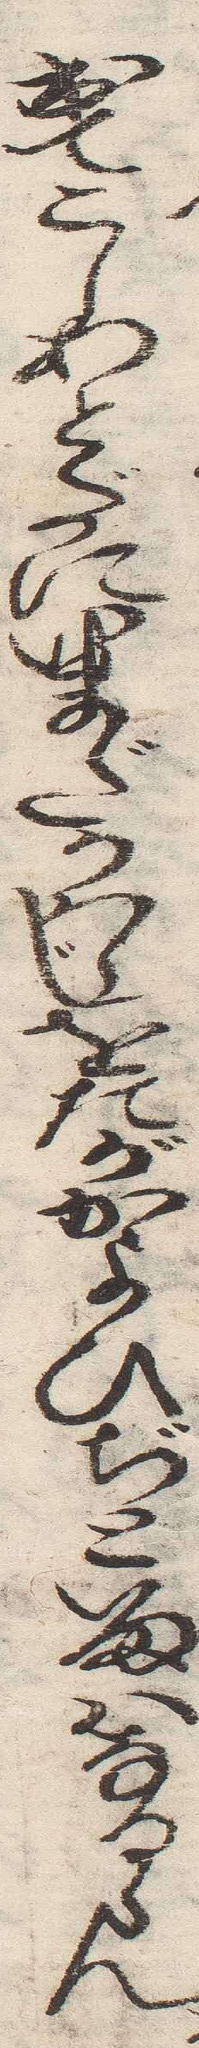出てこしあとだにいまだかはらじをたがかよひぢといまはなるらん
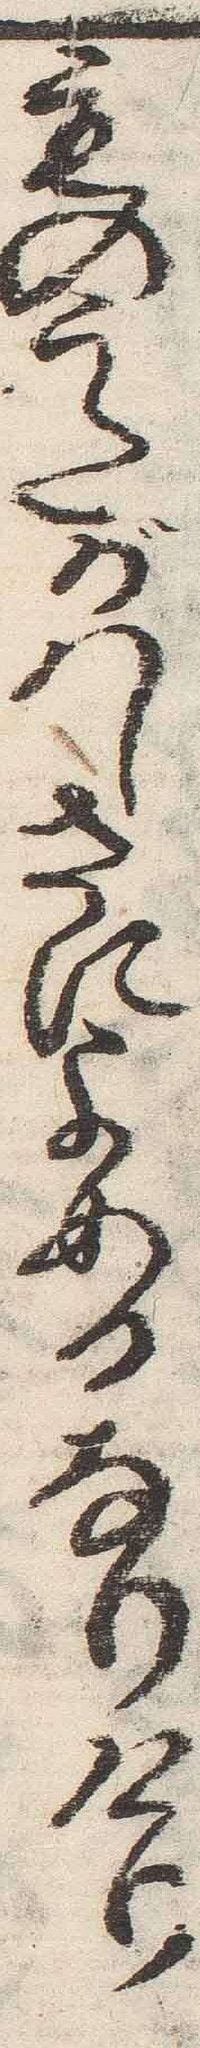ものうたがはしさによめるなりけり
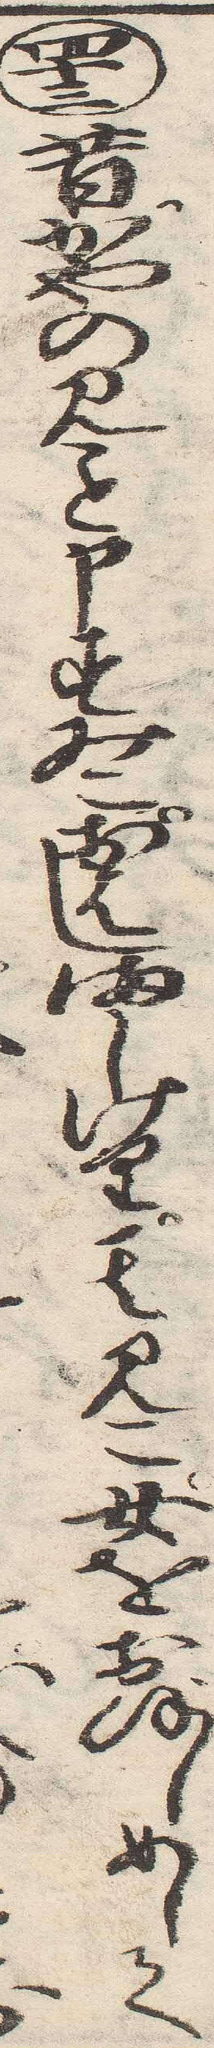四十三昔。かやのみこと申すみこ。おはしましけり。其みこ。女をおぼしめして
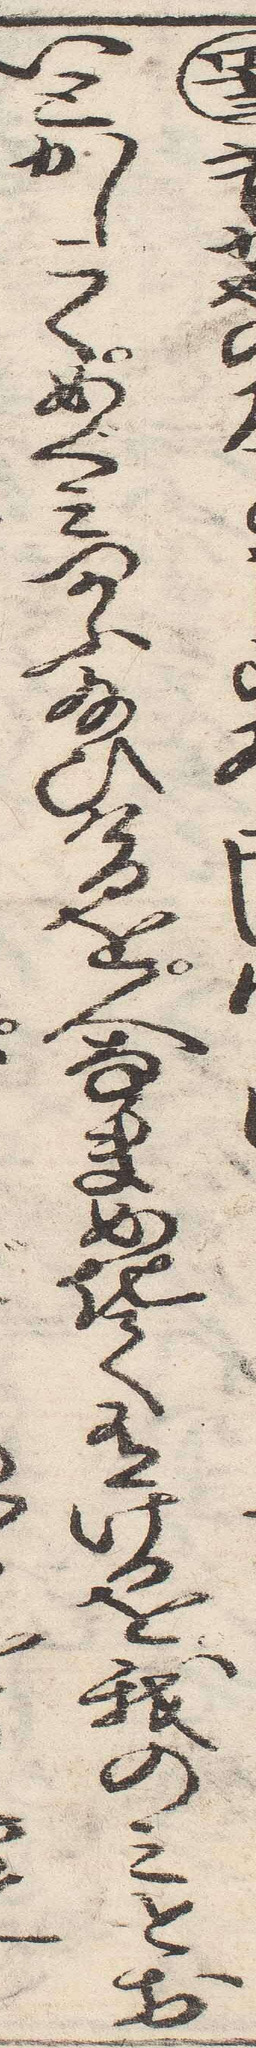いとかしこく。めぐみつかふ給ひけるを。人なまめきて有けるを。我のみとお
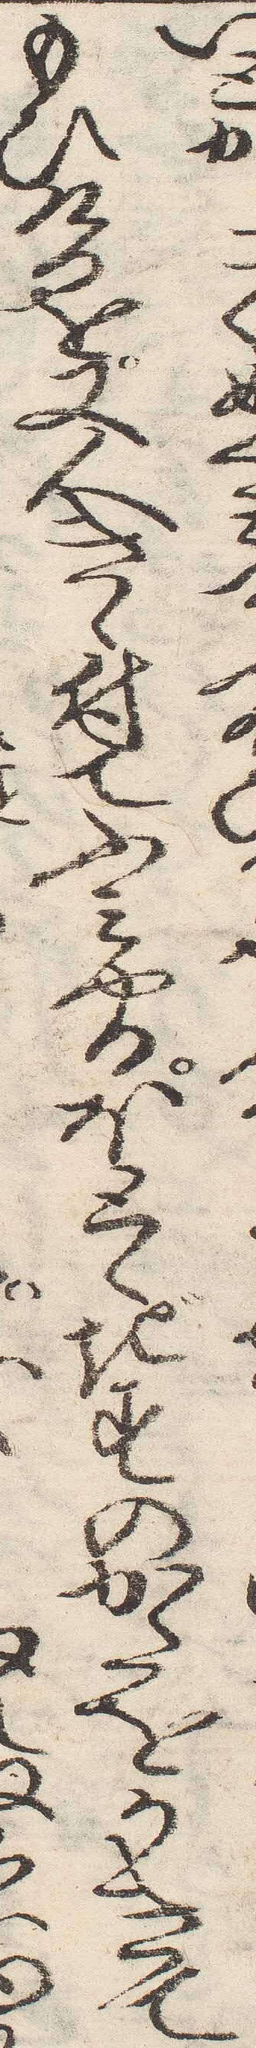もひけるを。又人きゝ付てふみやる。ほとゝぎすのかたをかきて
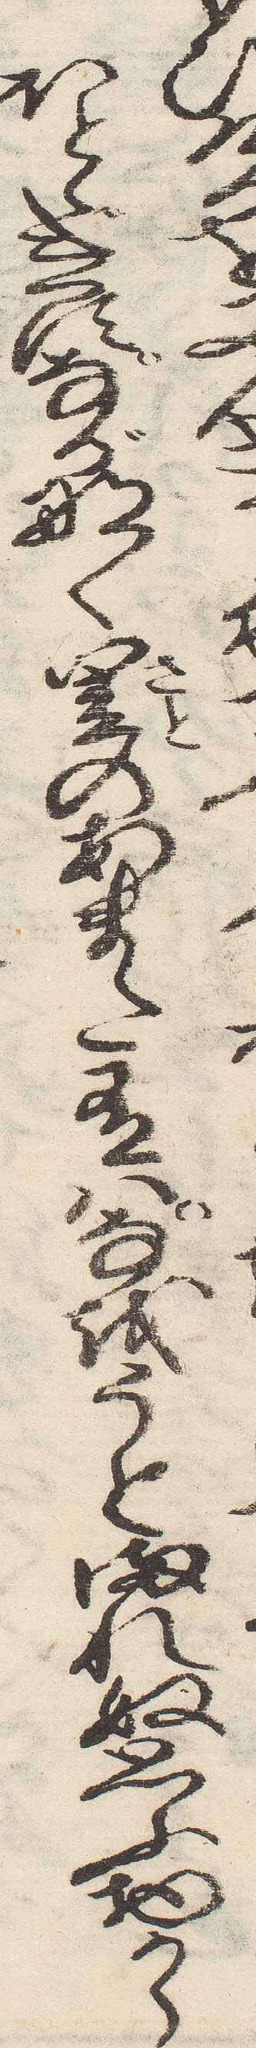ほとゝぎす。ながなく里のあまた有は。なをうとまれぬ思ふ物から
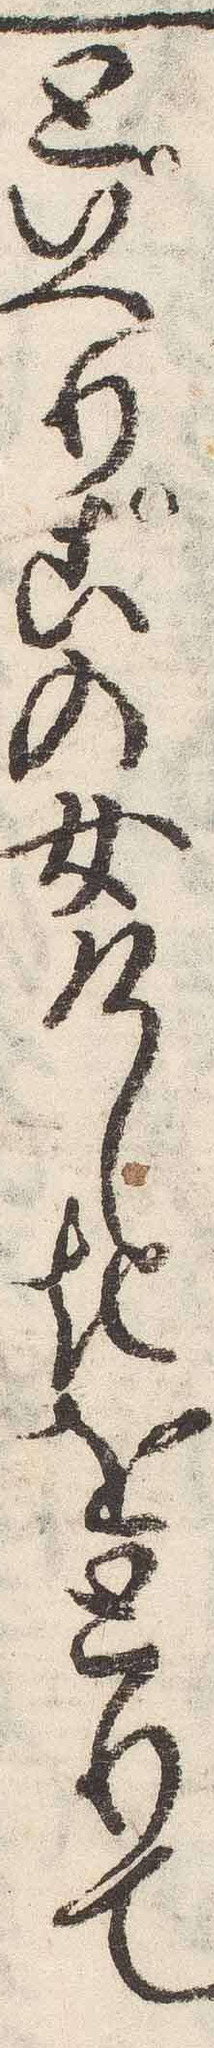と。いへり。この女けしきをとりて
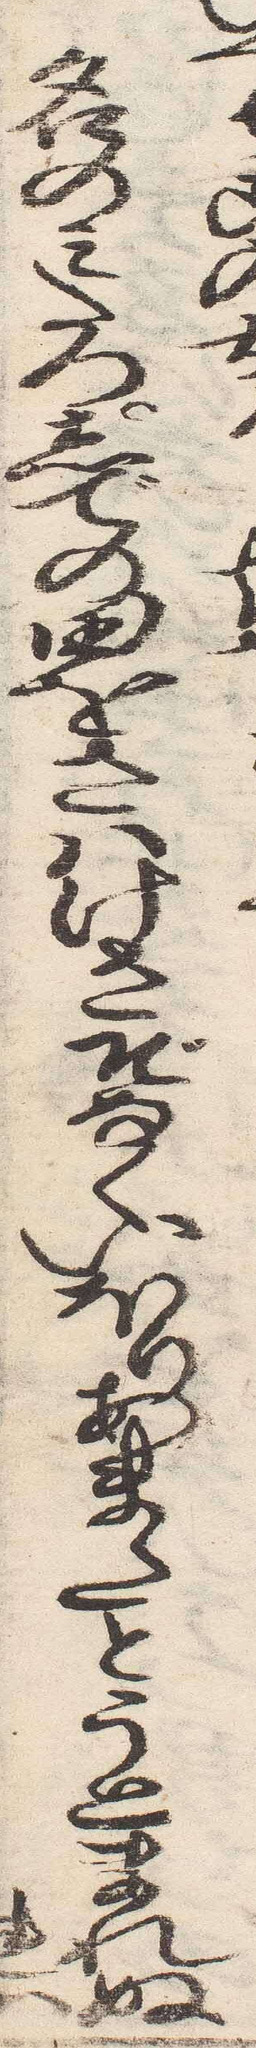名のみたつ。しでの田をさはけさぞなくいほりあまたとうとまれぬれは

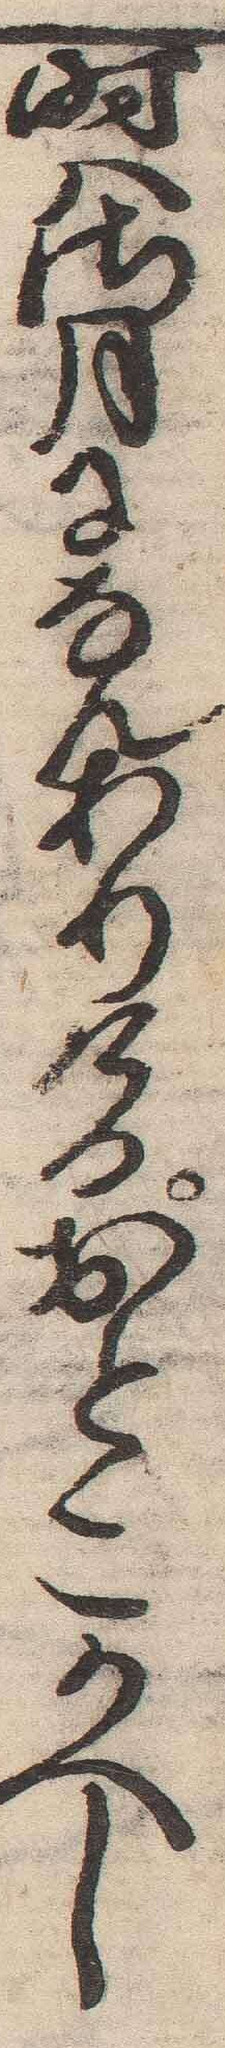時はさ月になんありける。おとこかへし
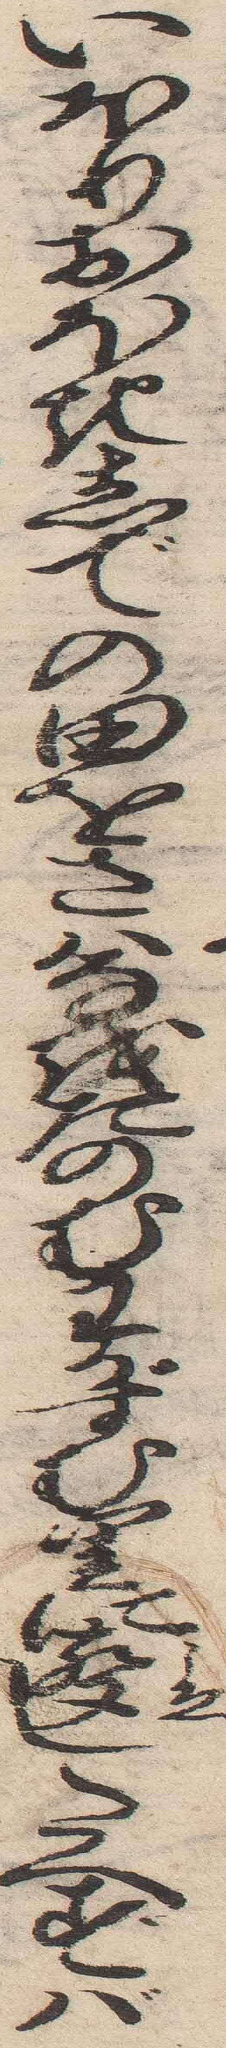いほりおほきしでの田をさはなをたのむわがすむ里に声したへずば
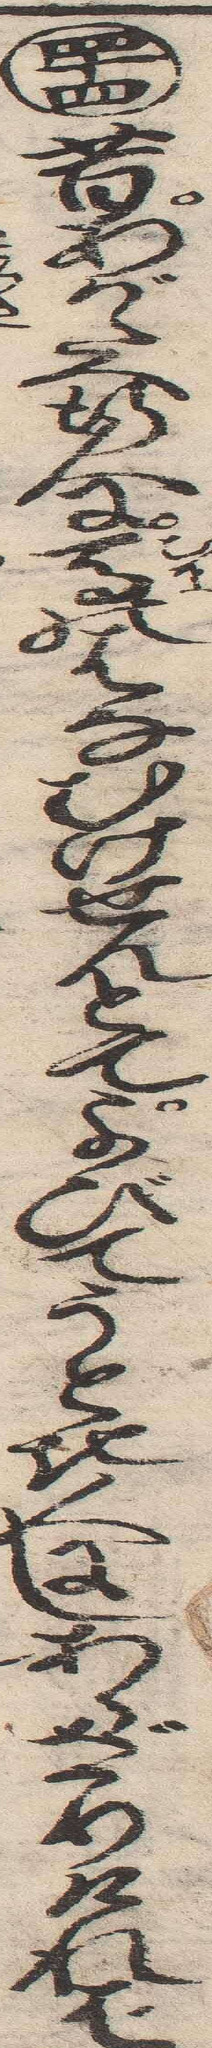四十四昔。あがたへ行人に。馬のはなむけせんとて。よびてうとき人にしあらざりければ
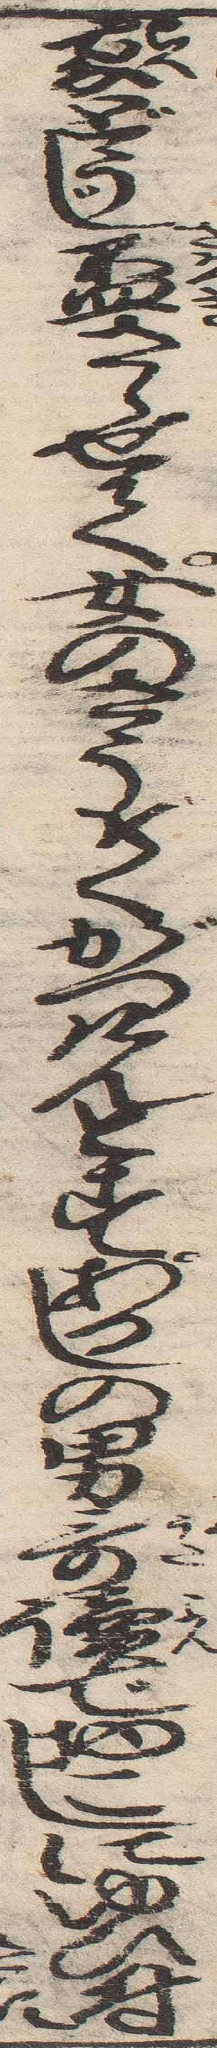家どうじ盃さゝせて。女のさうそくがつけんとす。あるしの男哥読で物こしにゆひ付さす
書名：伊勢物語
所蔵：東京学芸大学附属図書館 国文学研究資料館
